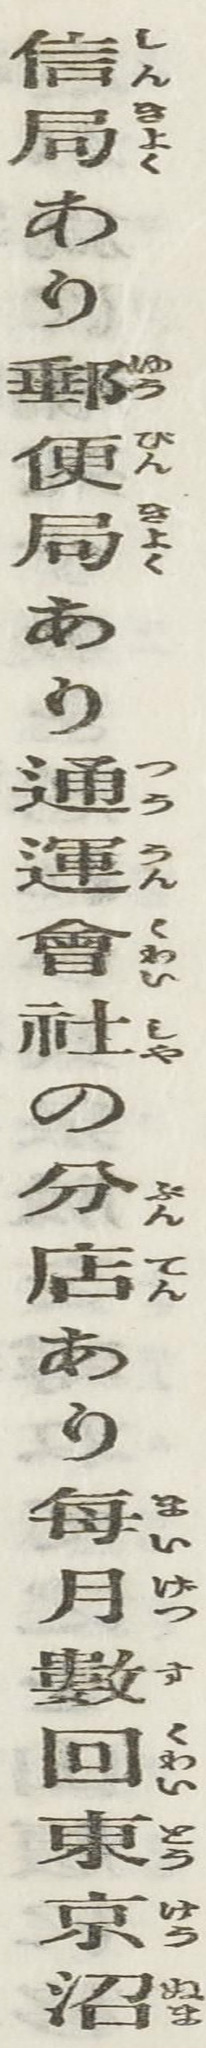信局あり郵便局あり通運會社の分店あり毎月数回東京沼
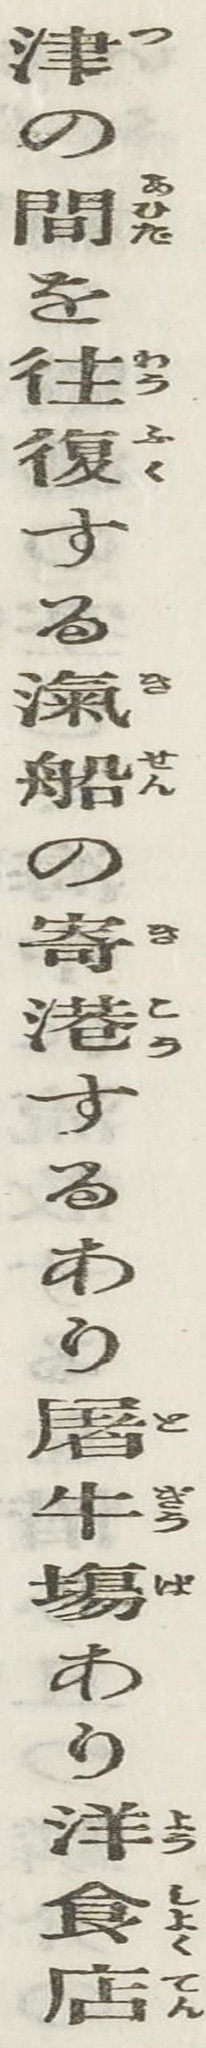津の間を往復する汽船の寄港するあり屠牛場あり洋食店
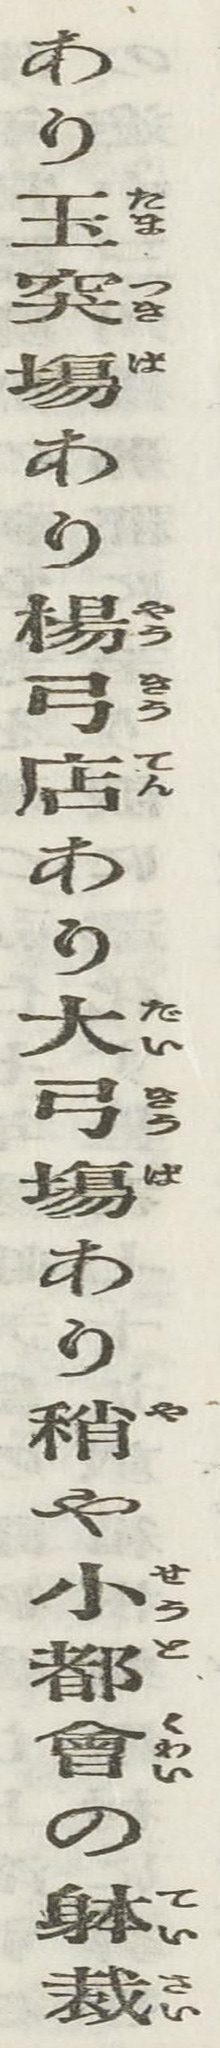あり玉突場あり楊弓店あり大弓場あり稍や小都会の躰裁
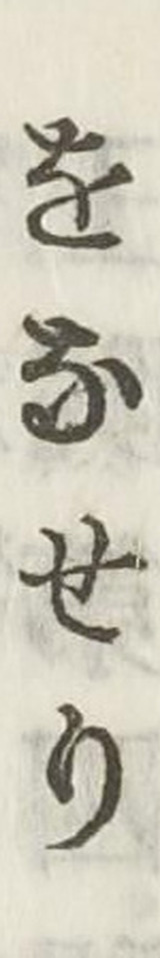をなせり
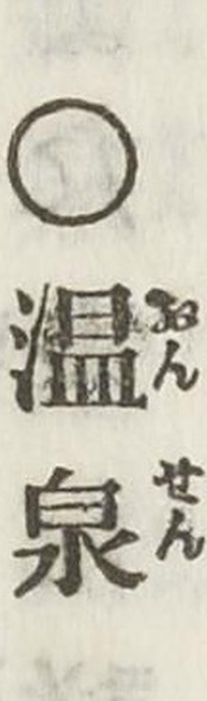○温泉
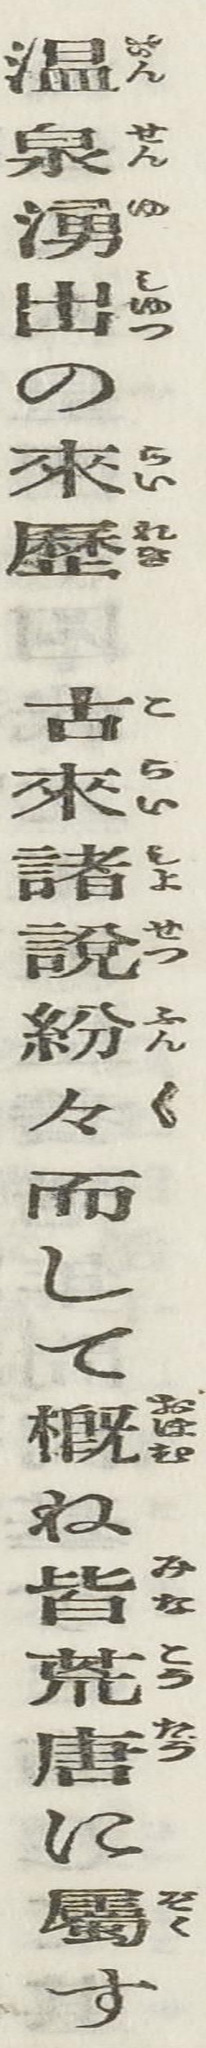温泉湧出の来歴古来諸説紛々而して概ね皆荒唐に属す
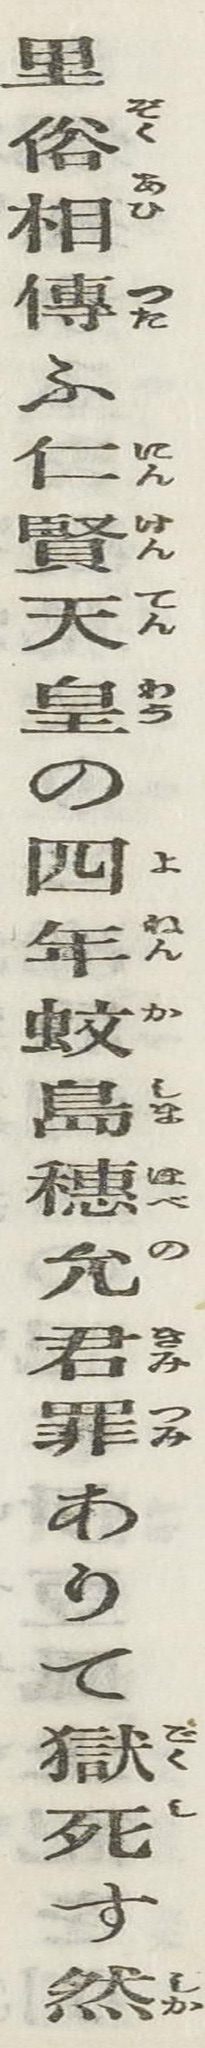里俗相傳ふ仁賢天皇の四年蚊島穂允君罪ありて獄死す然
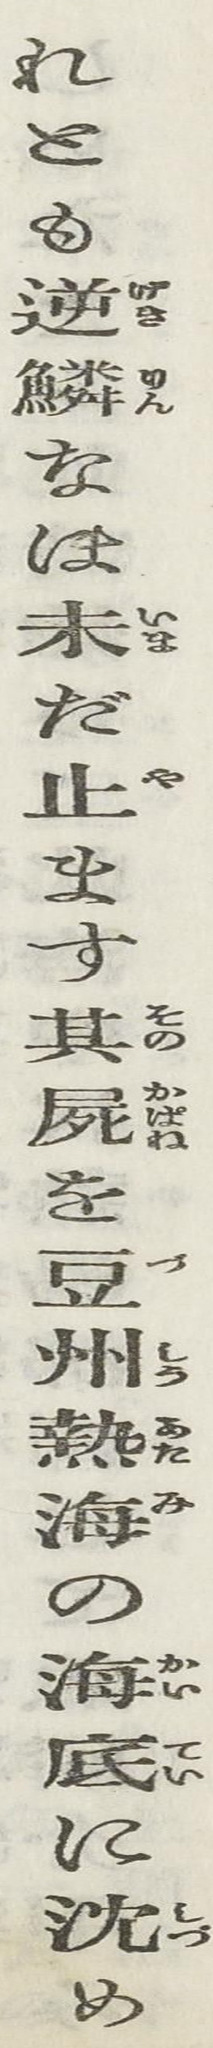れとも逆鱗なほ未だ止ます其屍を豆州熱海の海底に沈め

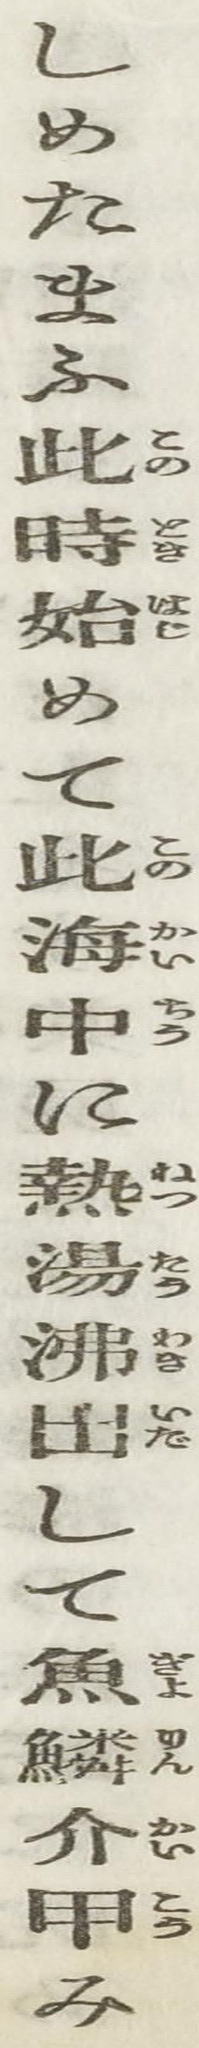しめたまふ此時始めて此海中に熱湯沸出して漁鱗介甲み
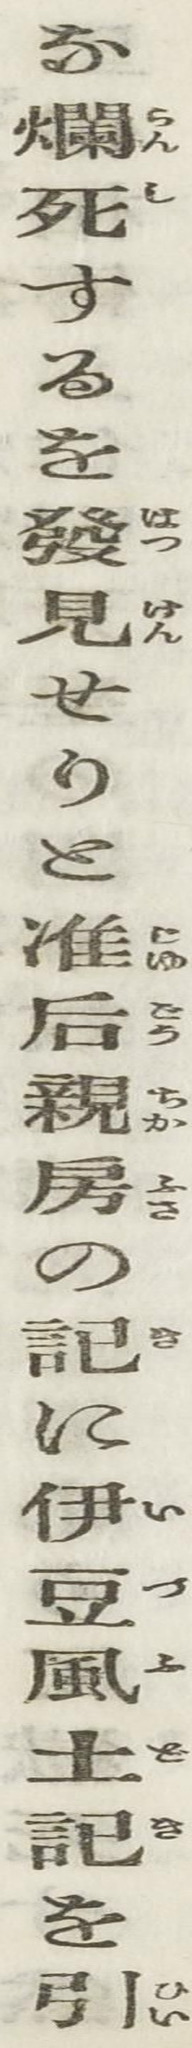な爛死するを発見せりと准后親房の記に伊豆風土記を引
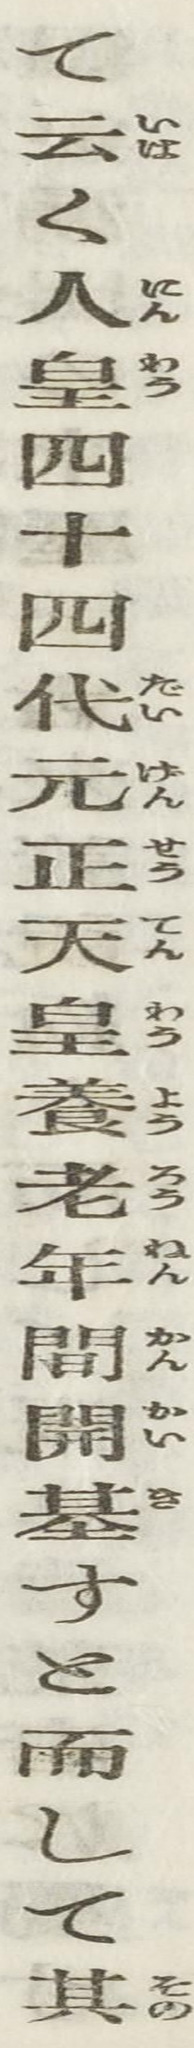て云く人皇四十四代元正天皇養老年間開基すと而して其
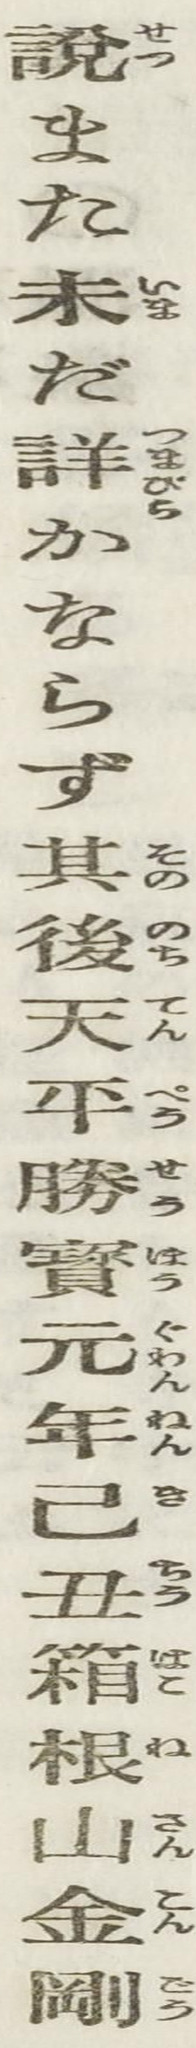説また未だ詳かならず其後天平勝宝元年己丑箱根山金剛
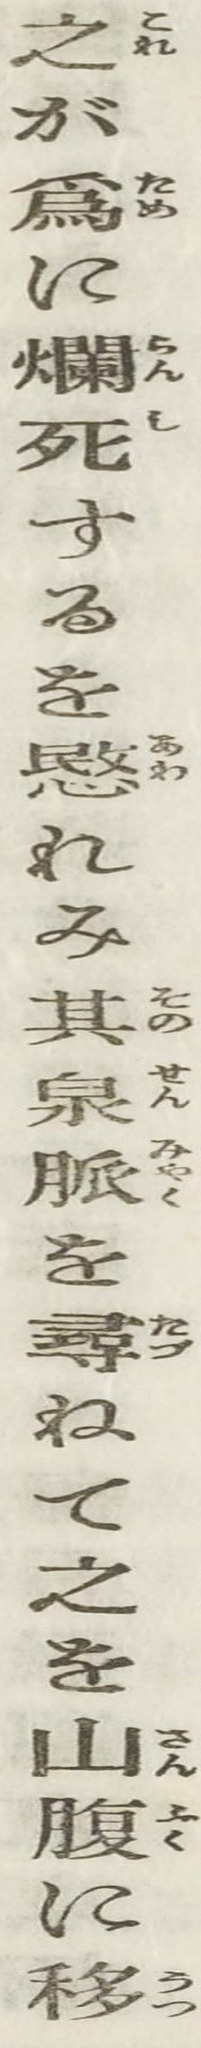之が為に爛死するを愍れみ其泉脈を尋ねて之を山腹に移
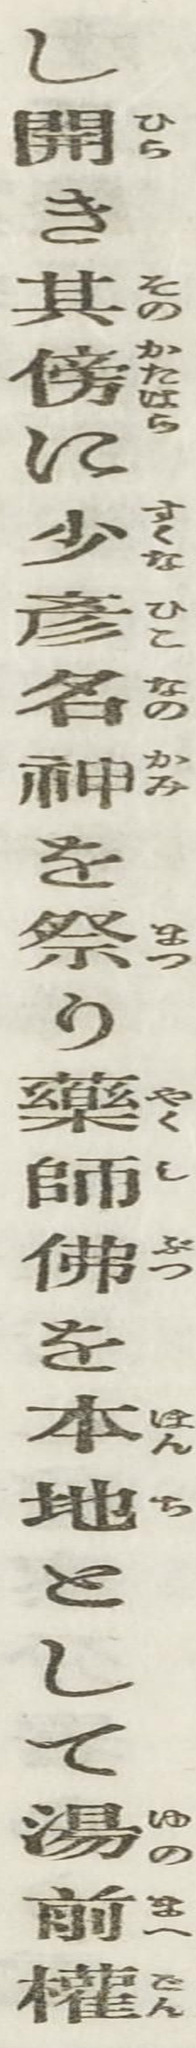し開き其傍に少彦名神を祭り薬師佛を本地として湯前権
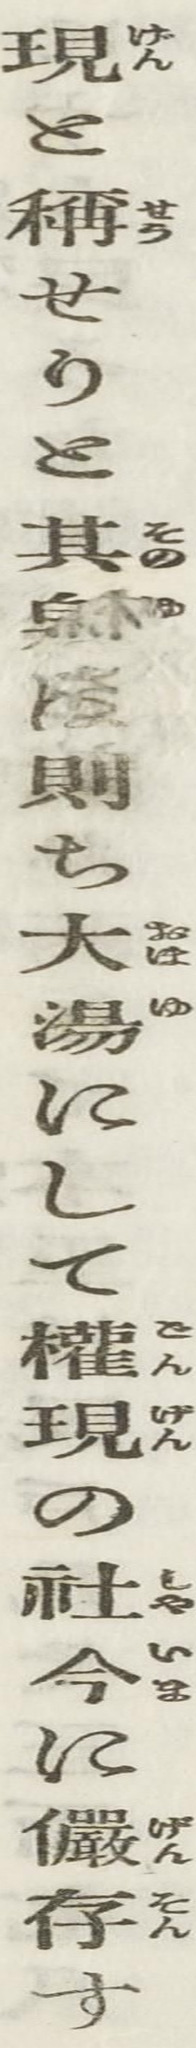現と称せりと其泉？は？則ち大湯にして権現の社今に現存す
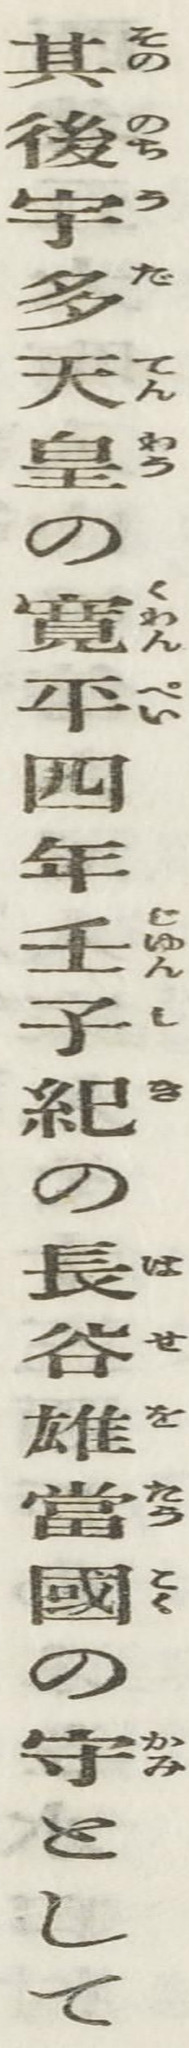其後宇多天皇の寛平四年壬子紀の長谷雄當國の守として
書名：熱海獨案内　全
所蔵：東京大学地震研究所図書室 Earthquake Research Institute Library, The University of Tokyo, JAPAN
